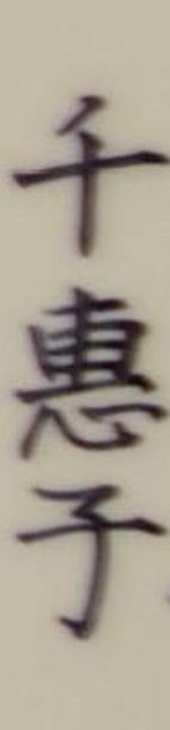千恵子
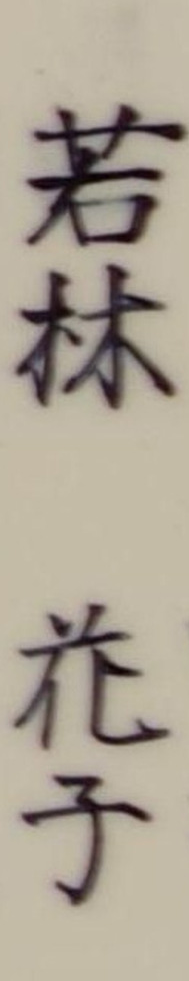若林花子
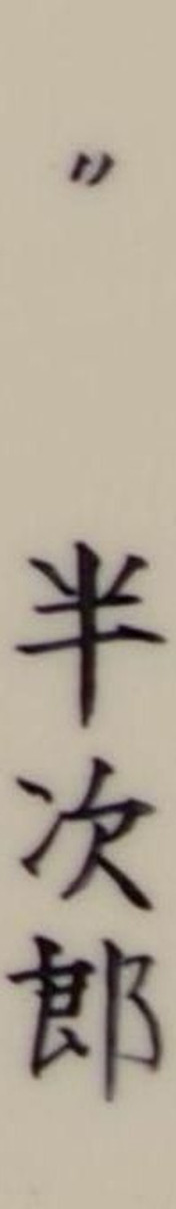半次郎
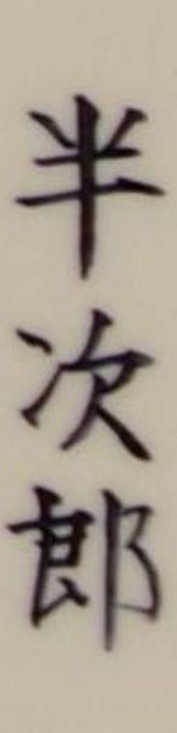半次郎
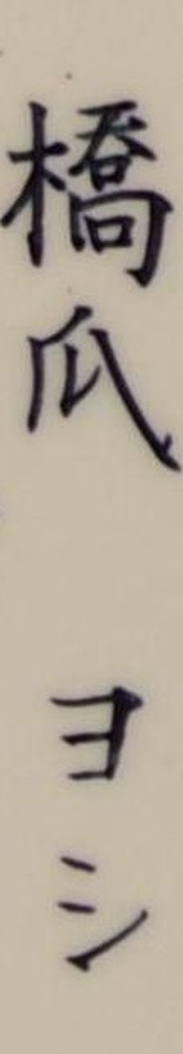橋瓜ヨシ
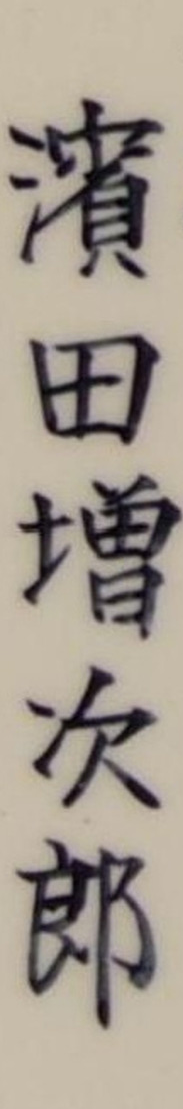濱田増次郎
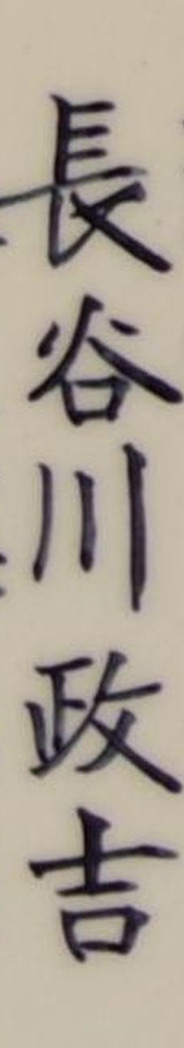長谷川政吉
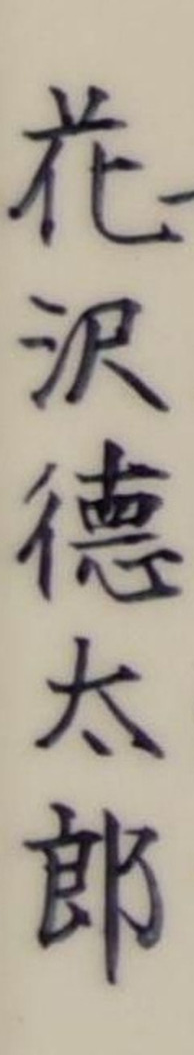花沢徳太郎

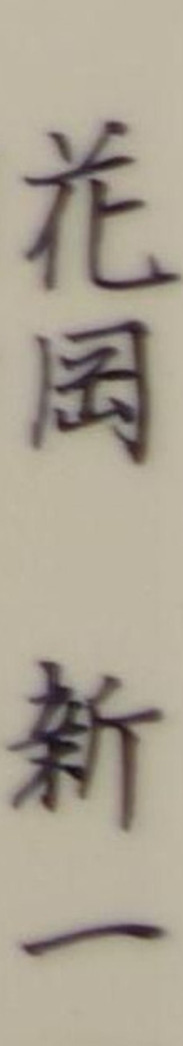花岡新一
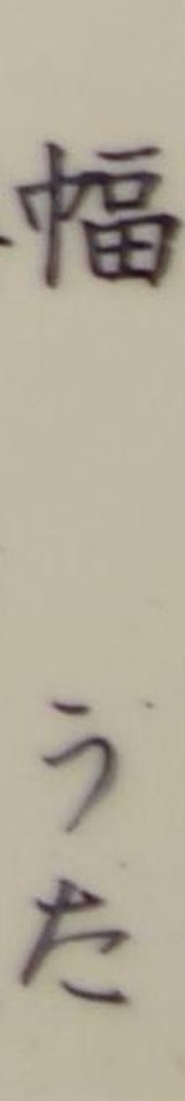幅うた
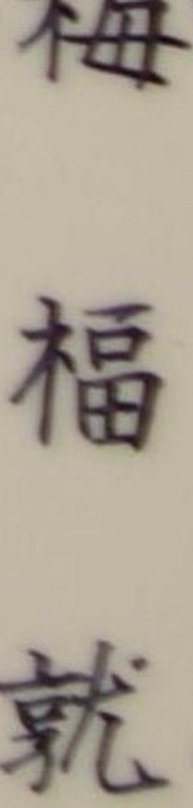梅福就
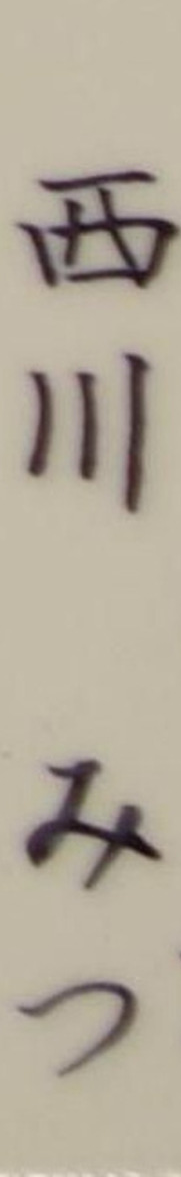西川みつ
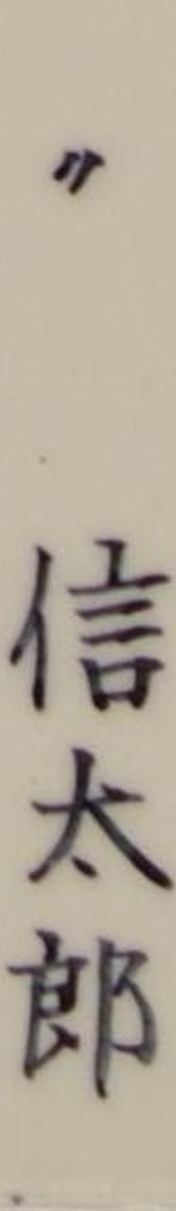信太郎
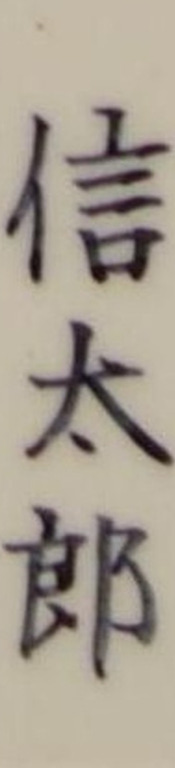信太郎
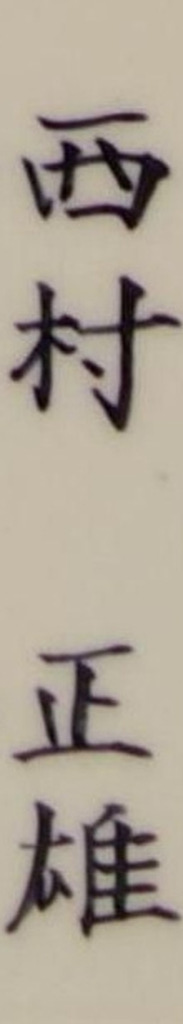西村正雄
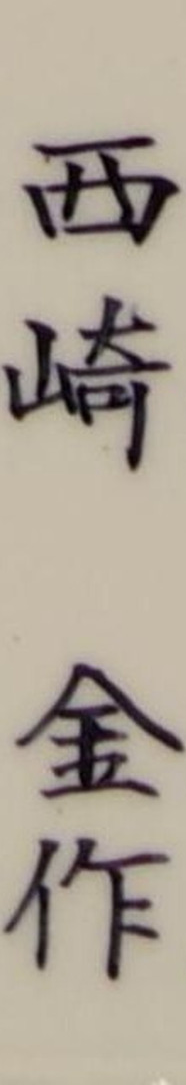西崎金作
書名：E~L
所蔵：高野山金剛峯寺
